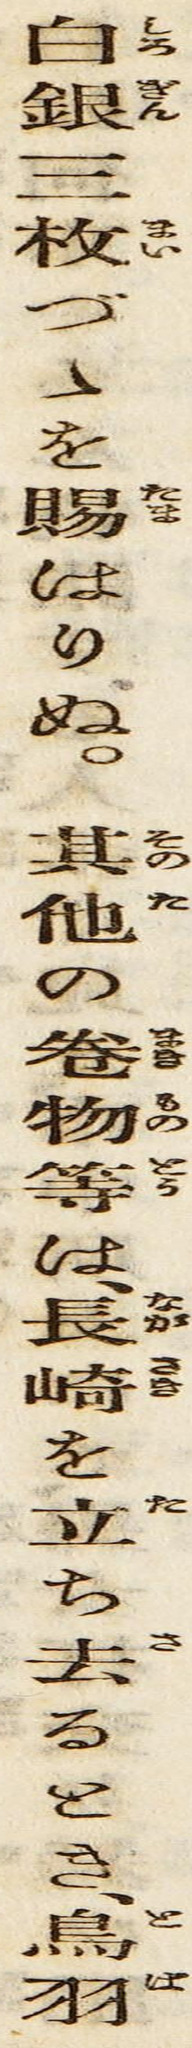白銀三枚づゝを賜はりぬ。其他の巻物等は、長崎を立ち去るとき、鳥羽
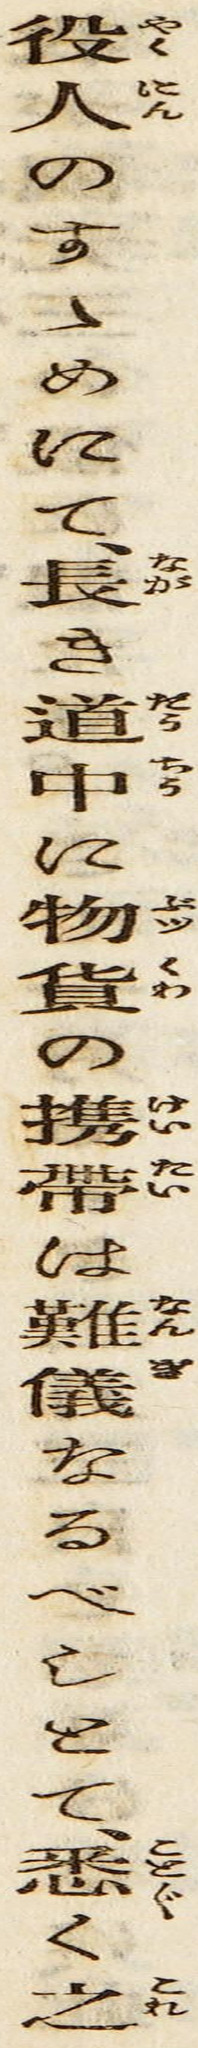役人のすゝめにて、長き道中に物貨の携帯は難儀なるべしとて、悉く之
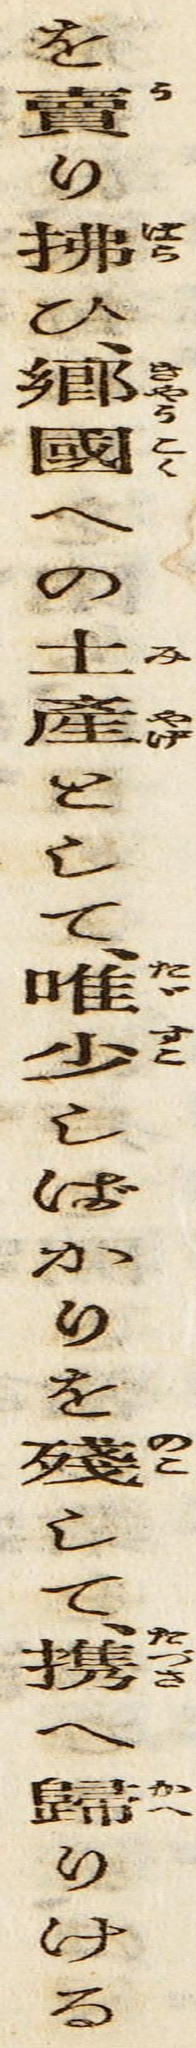を売り払ひ、郷国への土産として、唯少しばかりを残して、携へ帰りける
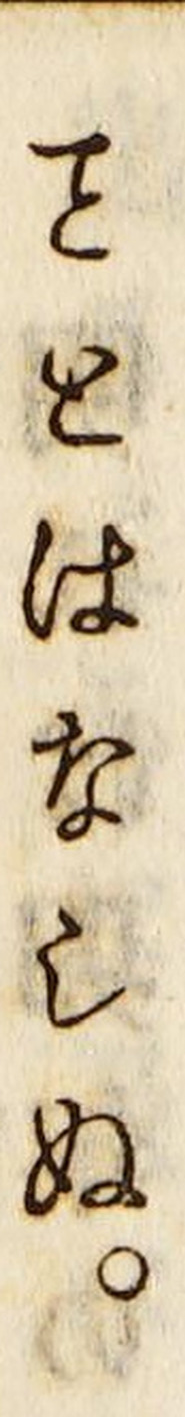こととはなしぬ。
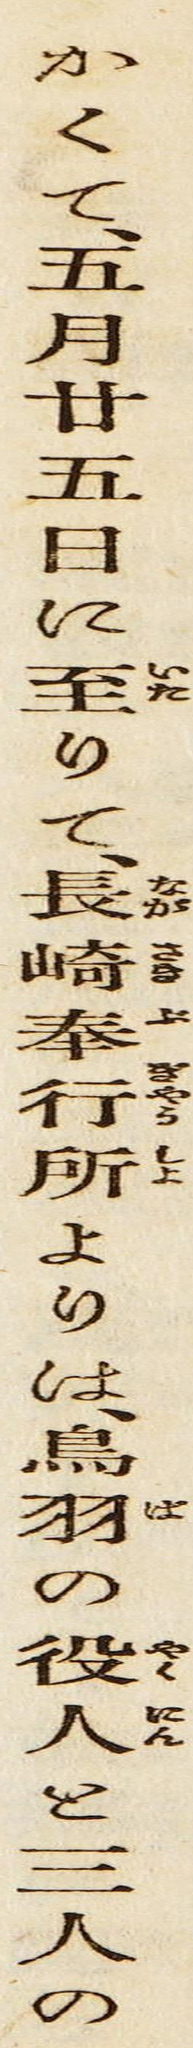かくて、五月廿五日に至りて、長崎奉行所よりは、鳥羽の役人と三人の
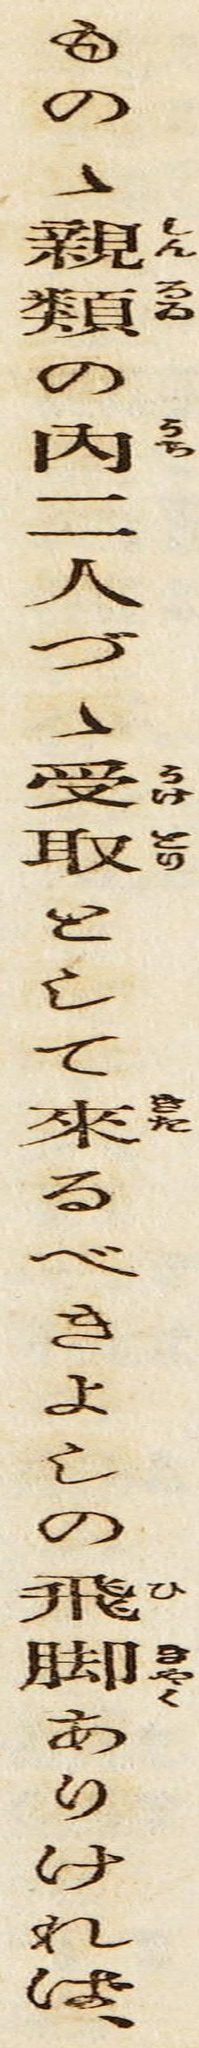ものゝ親類の内二人づゝ受取として来るべきよしの飛脚ありければ、
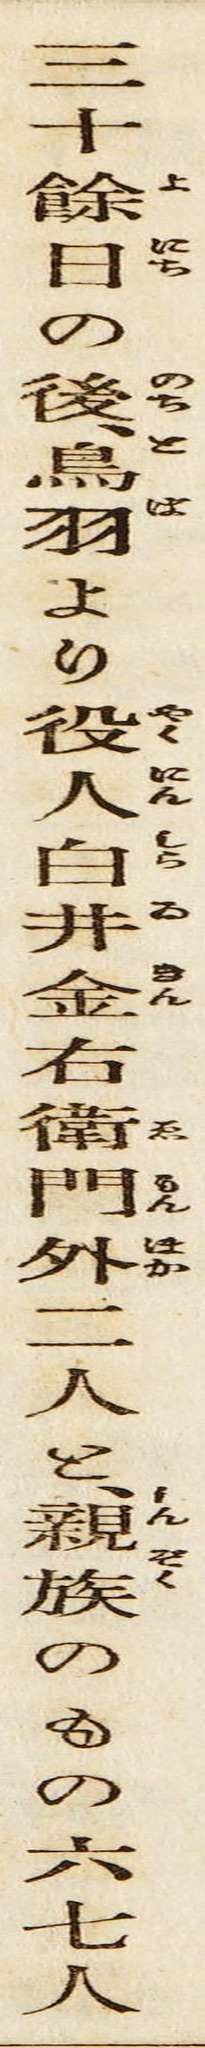三十余日の後、鳥羽より役人白井金右衛門外二人と、親族のもの六七人
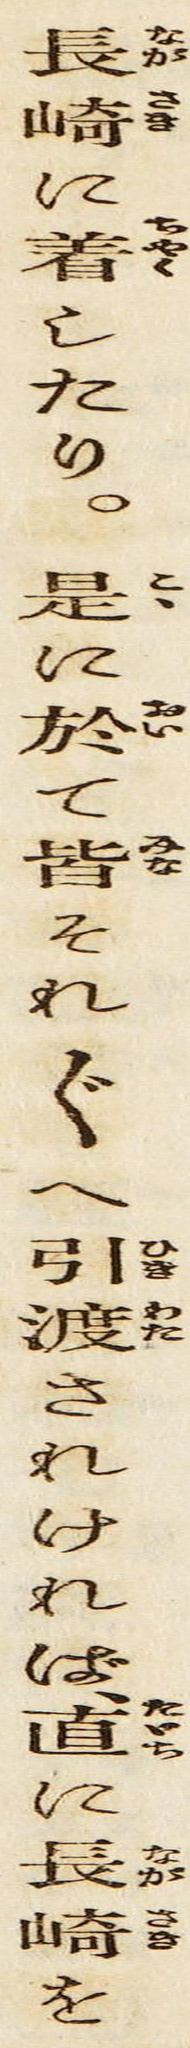長崎に着したり。是に於て皆それ〴〵へ引渡されければ、直に長崎を
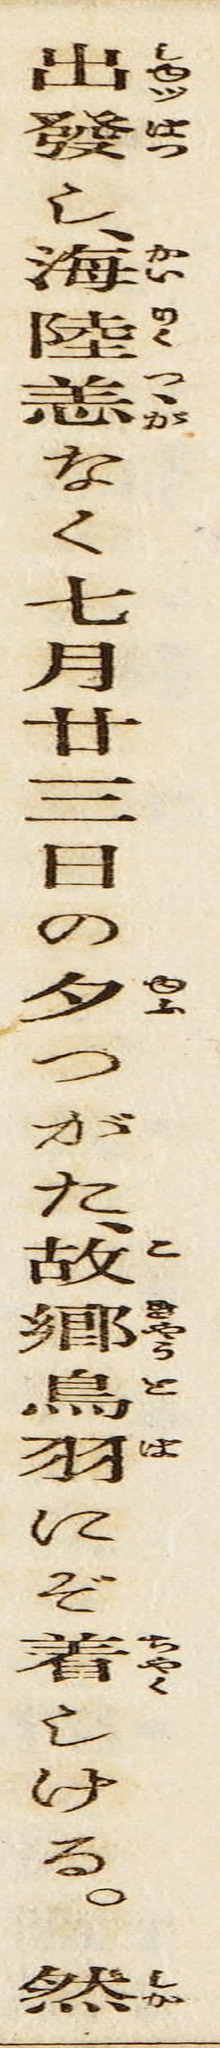出発し、海陸恙なく七月廿三日の夕つがた、故郷鳥羽にぞ着しける。然
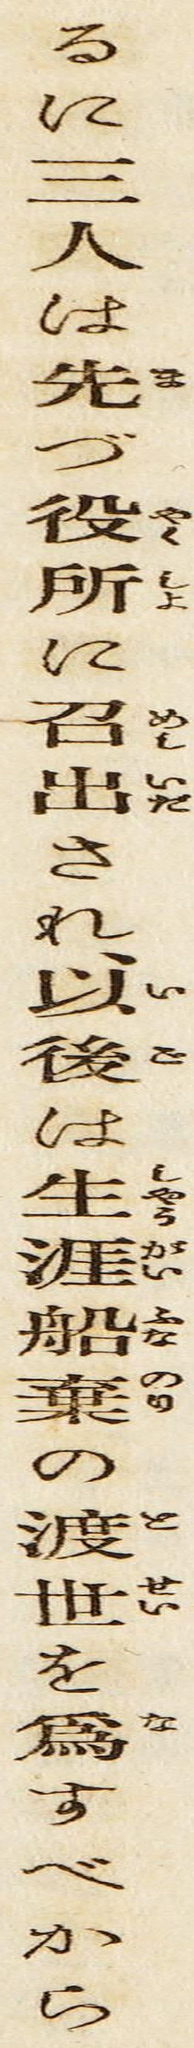るに三人は先づ役所に召出され、以後は生涯船棄の渡世を為すべから
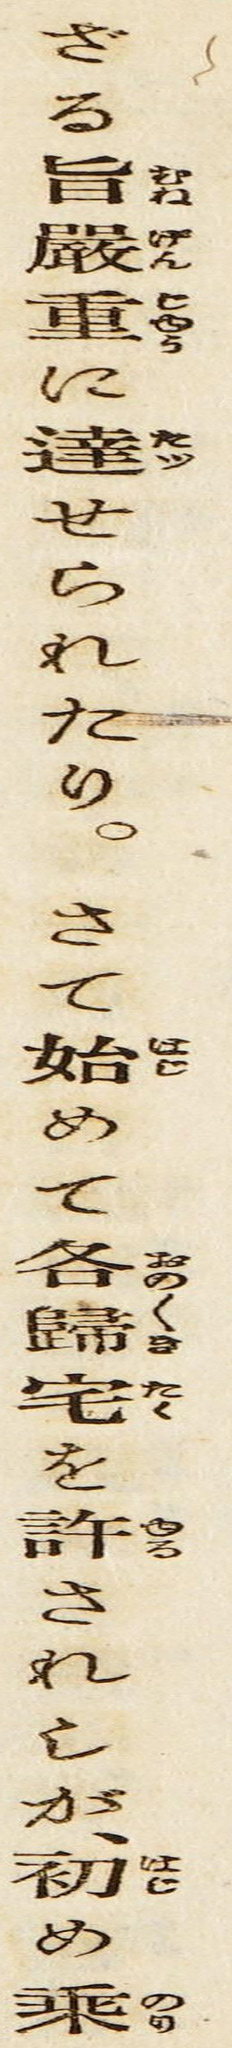ざる旨厳重に達せられたり。さて始めて各帰宅を許されしが、初め乗
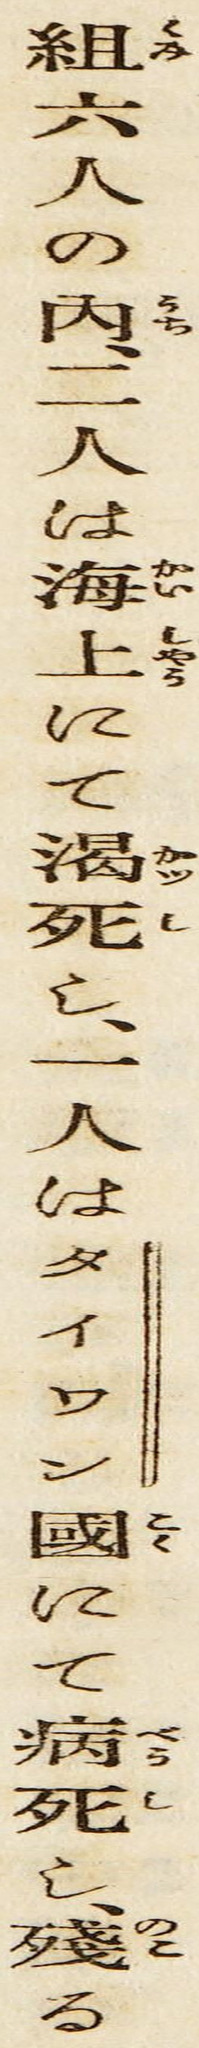組六人の内、二人は海上にて渇死し、一人はタイワン国にて病死し、残る
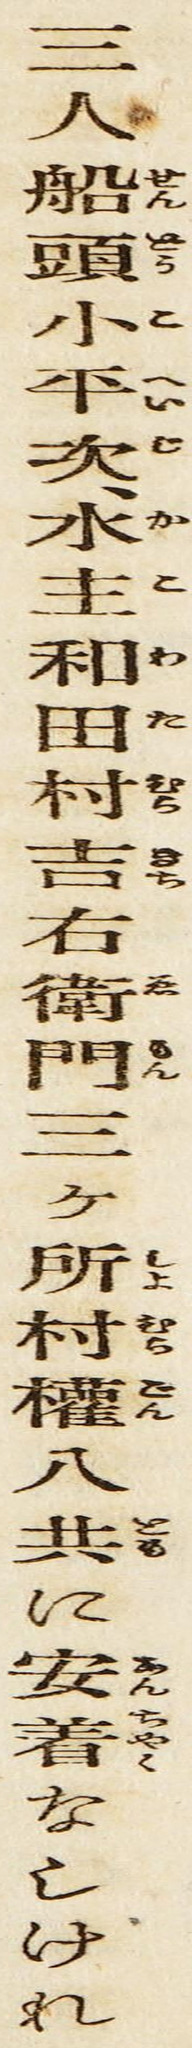三人船頭小平次、水主和田村吉右衛門三ケ所村権八共に安着なしけれ
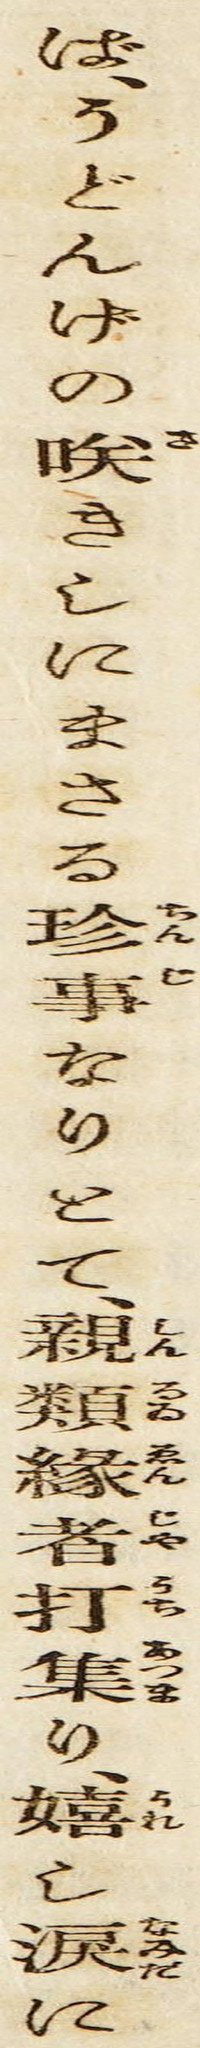ば、うどんげの咲きしにまさる珍事なりとて、親類縁者打集り、嬉し涙に
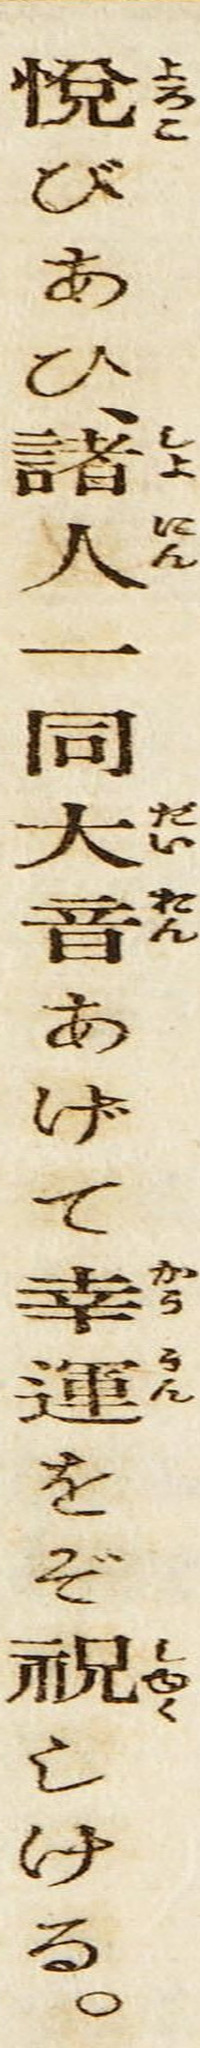悦びあひ、諸人一同大音あげて幸運をぞ祝しける。

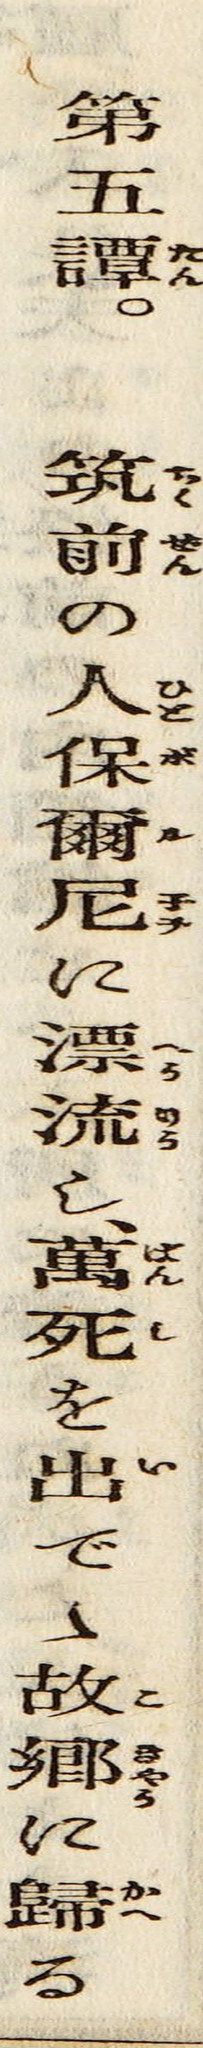第五譚。筑前の人保爾尼に漂流し、万死を出でゝ故郷に帰る
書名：日本漂流譚
